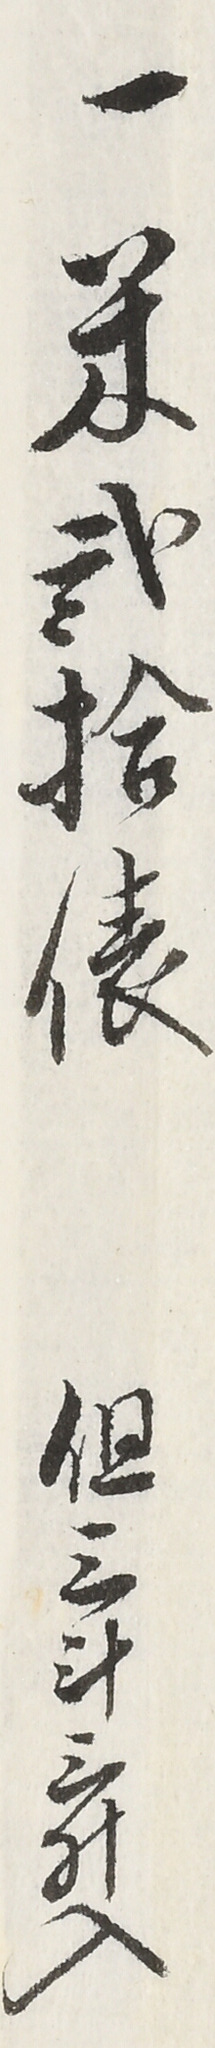一米弐拾俵但三斗三升入
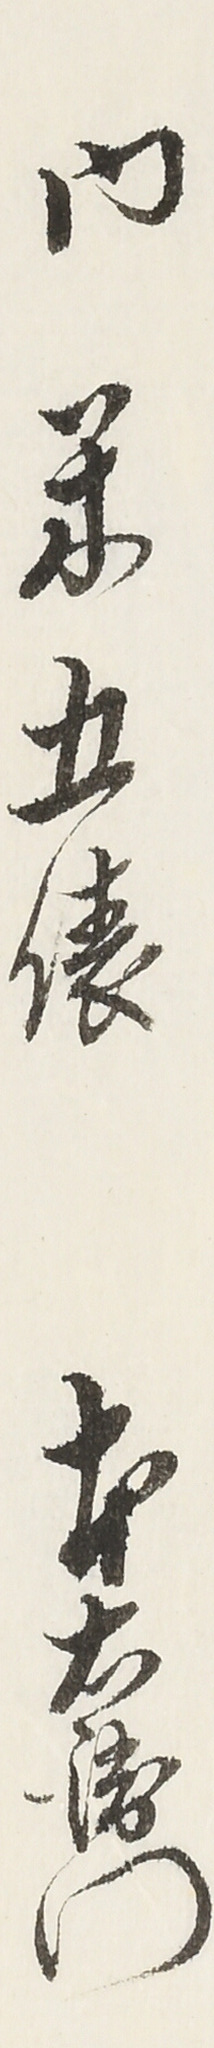内米五俵本右衛門
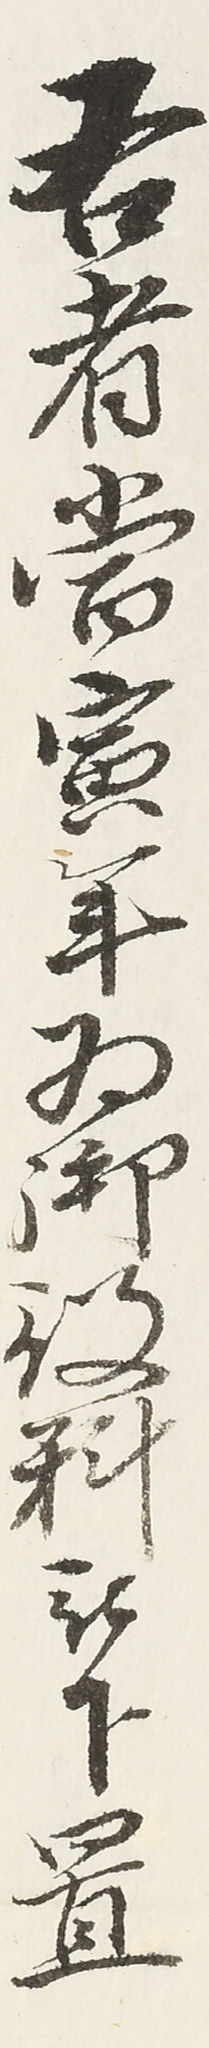右者当寅年為御役料被下置
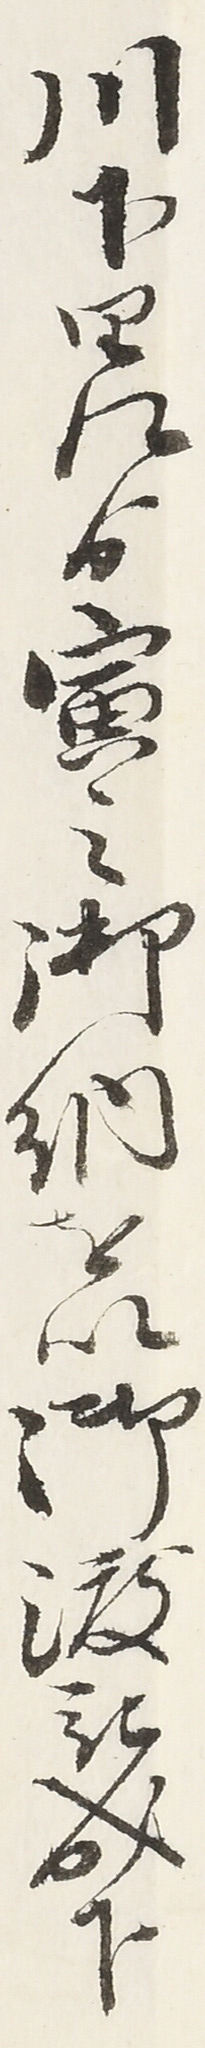川下四郷ゟ寅之御納を以御渡被成下
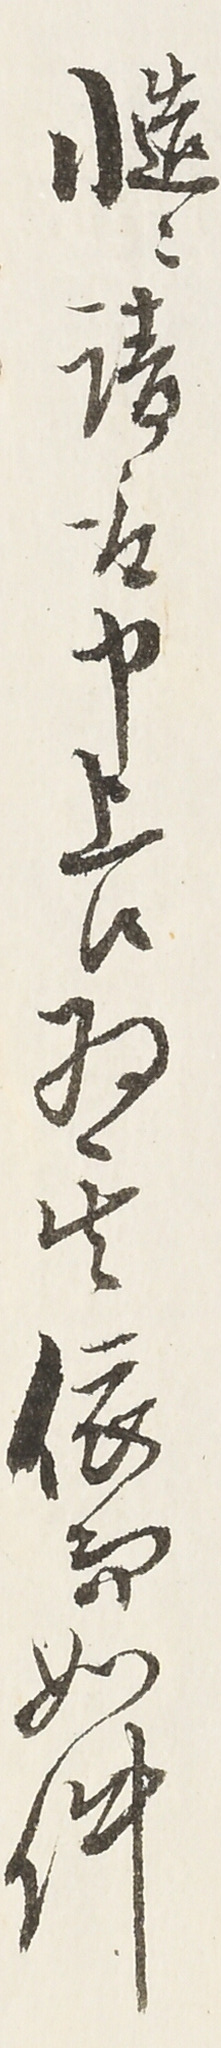慥ニ請取申上候為其依而如件
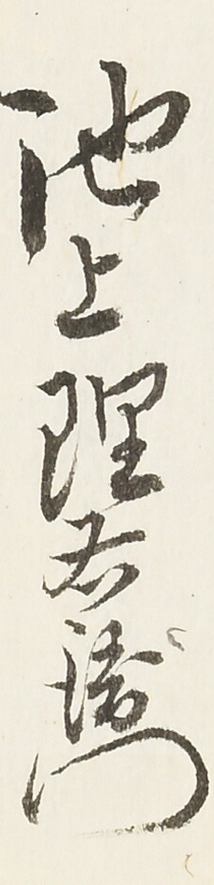池上本右衛門
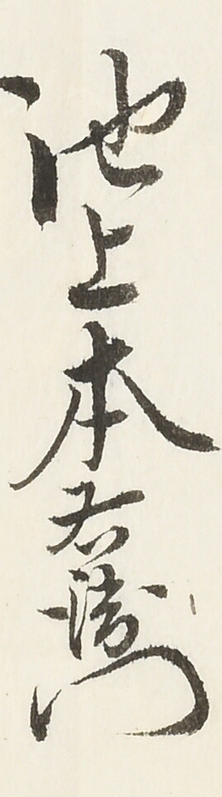池上本右衛門
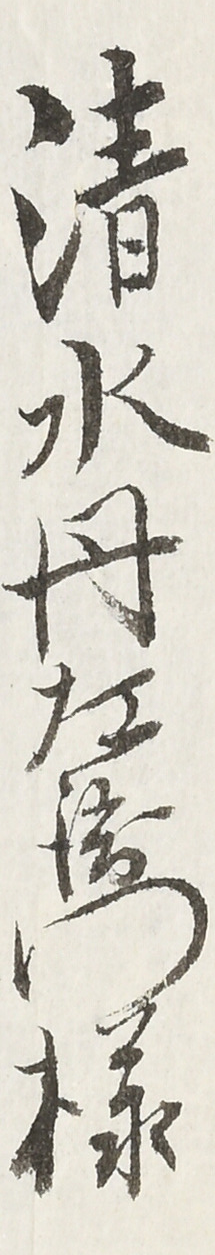清水丹左衛門様
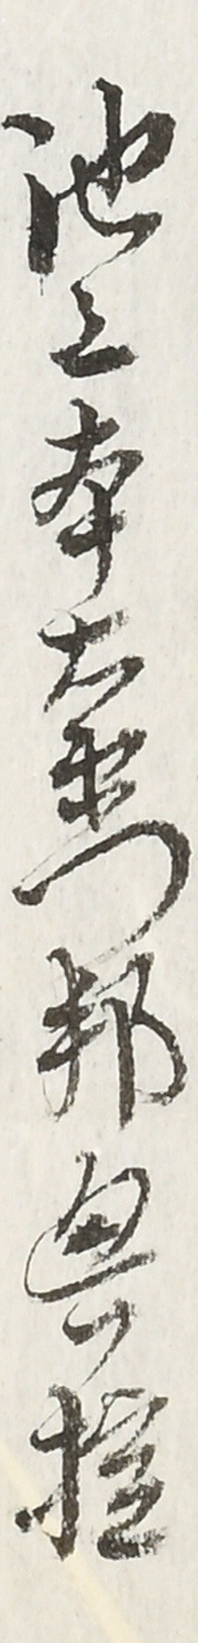池上本右衛門邦興控
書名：覚
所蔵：伊那市立高遠町図書館・合同会社AMANE
